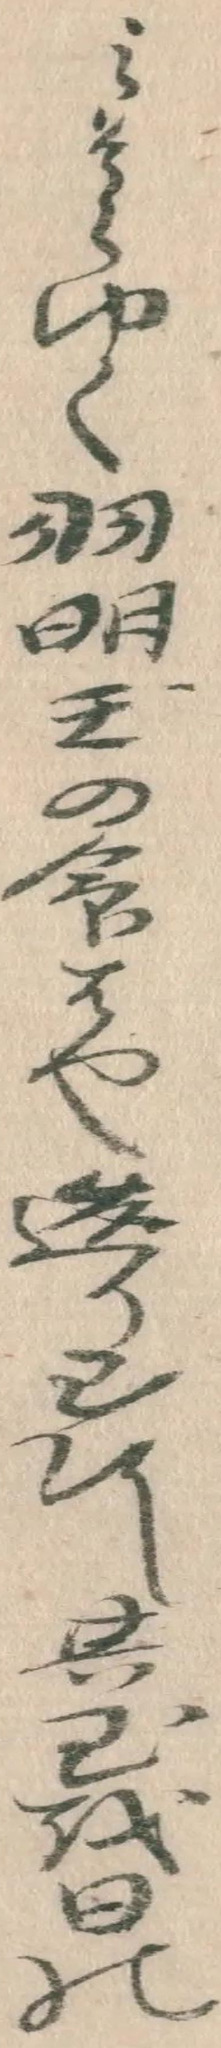みそらゆく羽明玉の命そや造り玉ひし其玉を日の
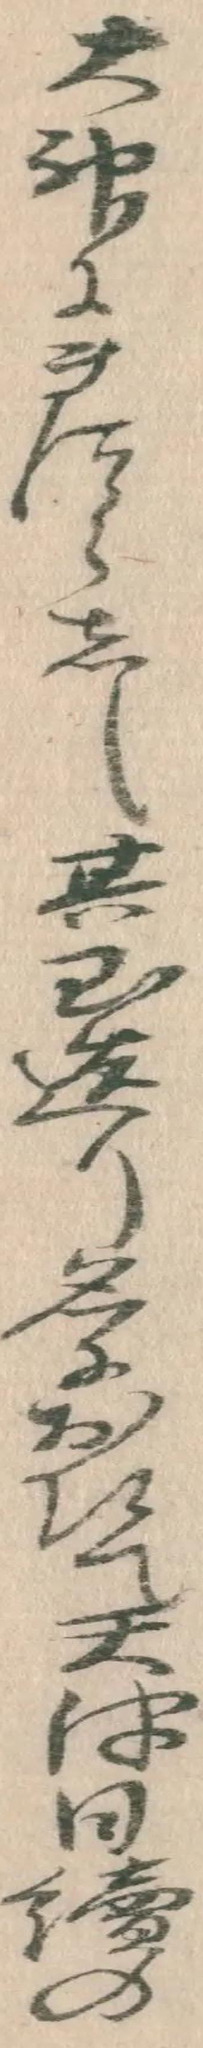大神にまつらしし其玉造り名におひて天津日続の
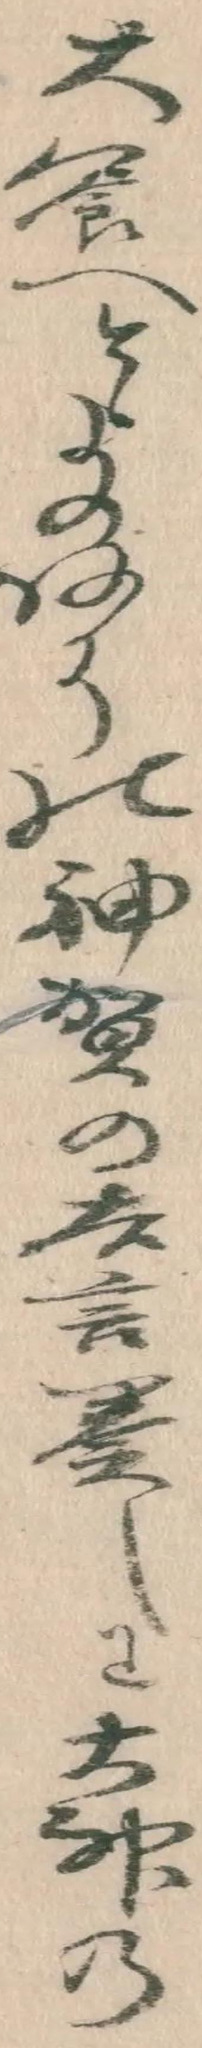大饗へとよのあかりの神賀の吉言奏しに大神の
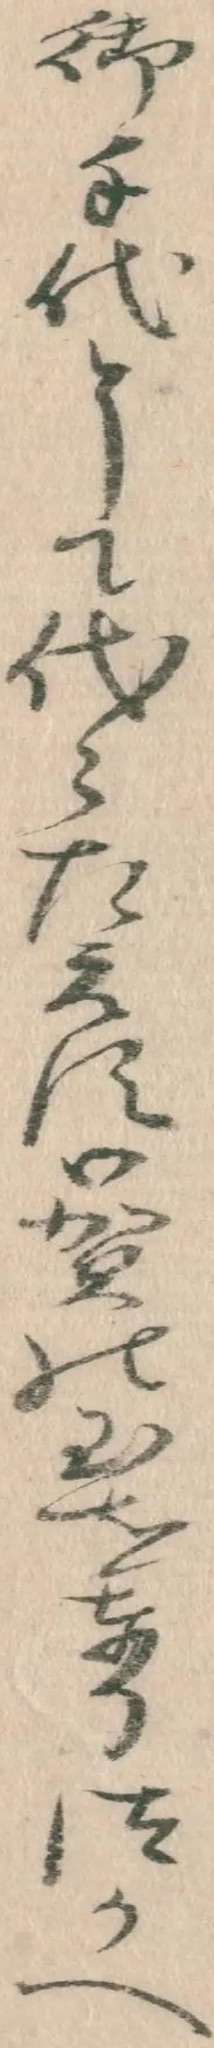御手代として代々たえす御賀の玉を奉りつかへ
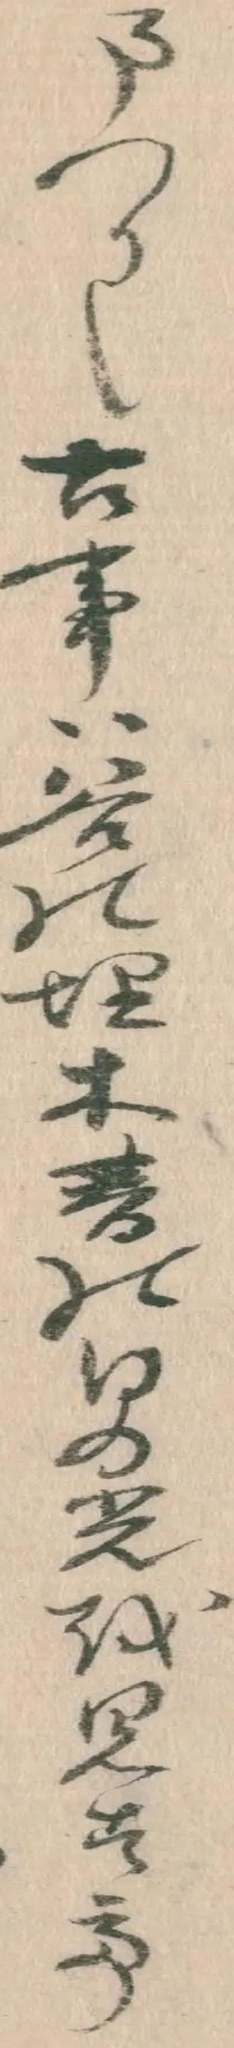まつりし古事は谷の埋木春の日の光を見すて
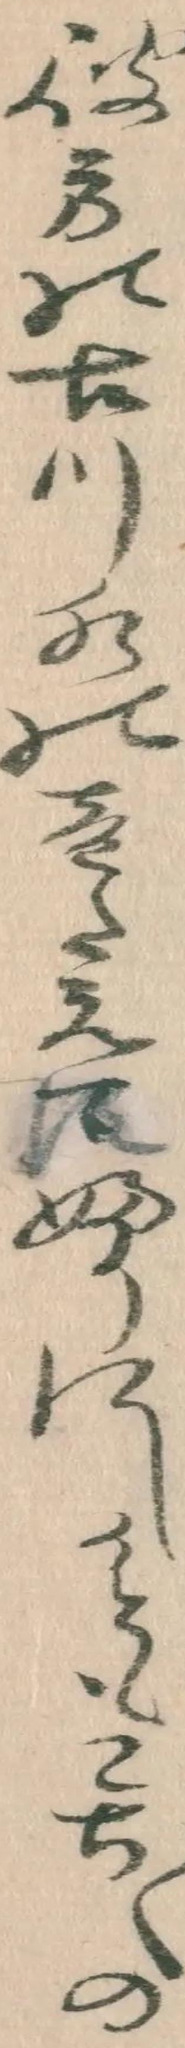彼方の古川水の音たえてふりにしかともこち〳〵の
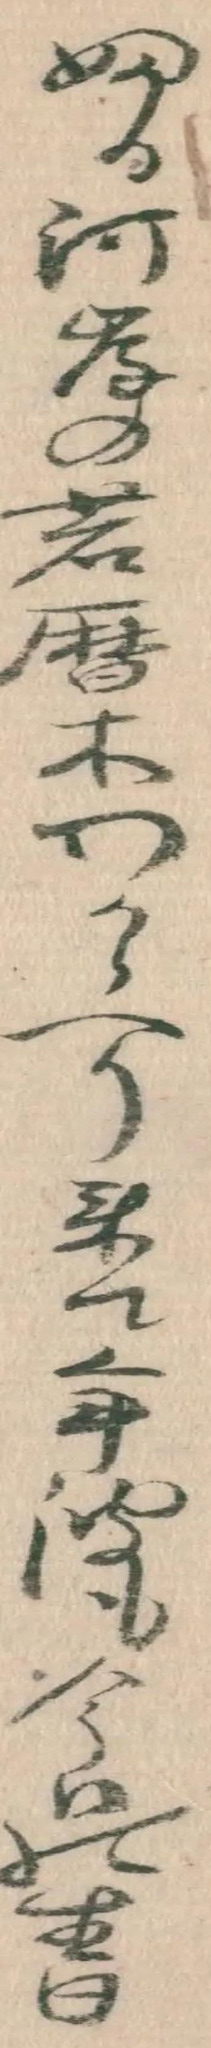ふる河岸の若暦木わかゝへり来て年波も今日の生日
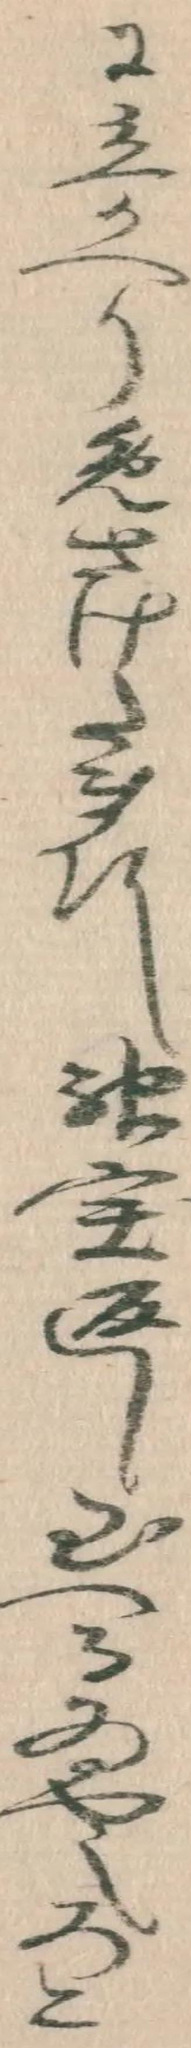に立かへりめさけたまひし神宝返し玉へるゐやしろと
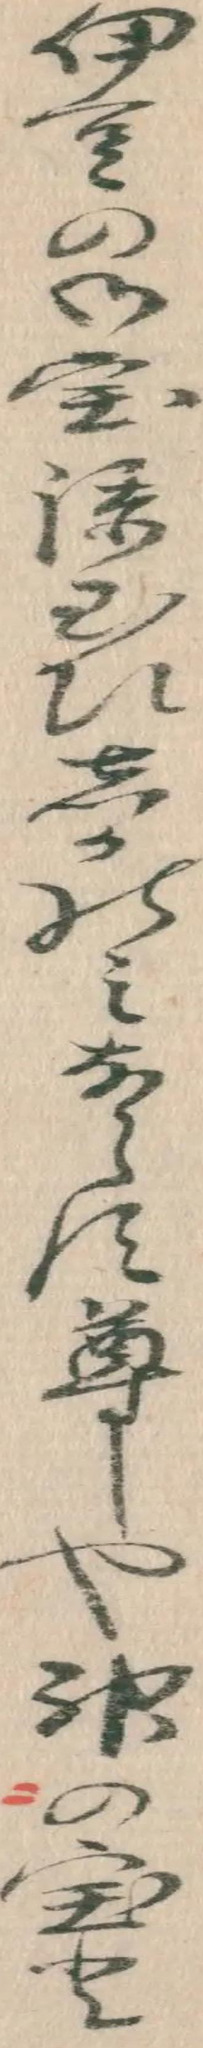伊豆の御宝添玉ひしかのみならす尊しや神の宝と
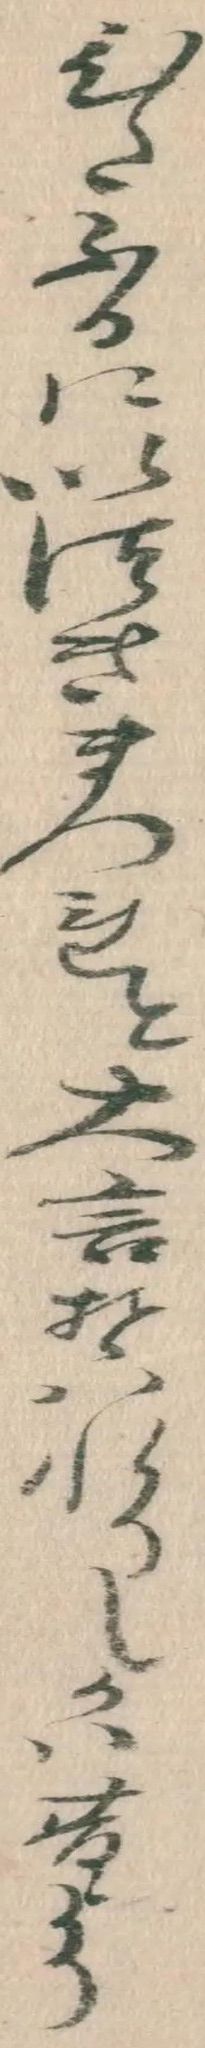ひたふるにいつきまつれと大言そはれりしかは昔より
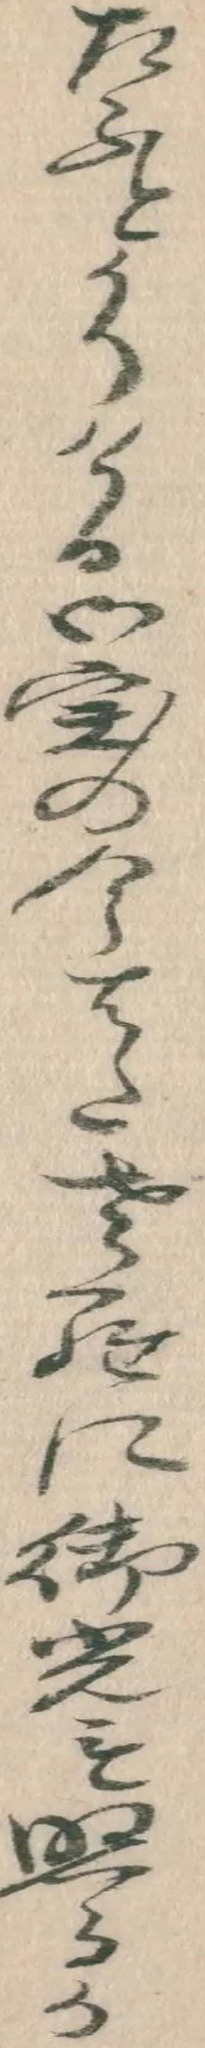たふとかりける御宝の今はたさらに御光も照るか
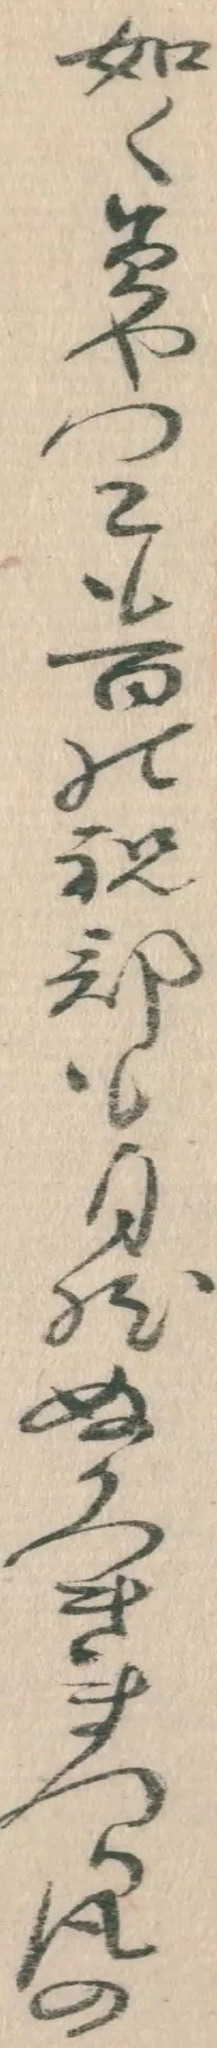如くみやつこも百の祝部も自然ぬかつきまつり風の
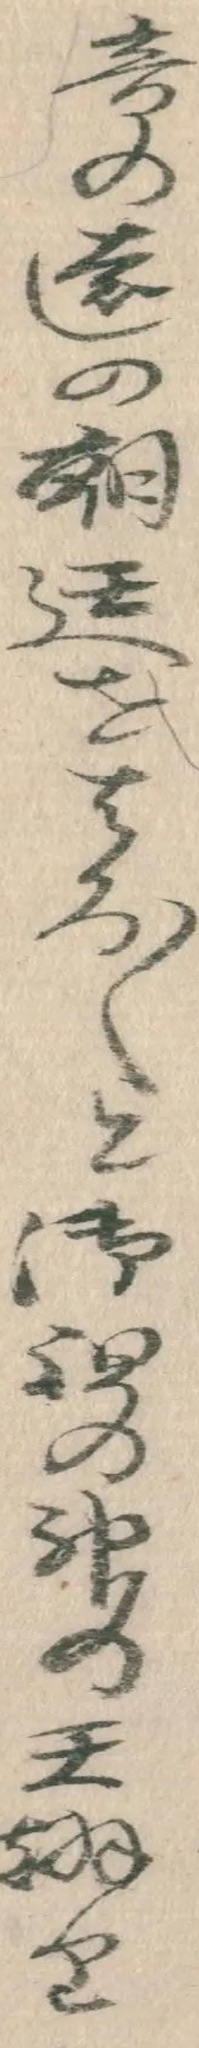音の遠の朝廷をはろ〳〵と御祖の神の天翔り
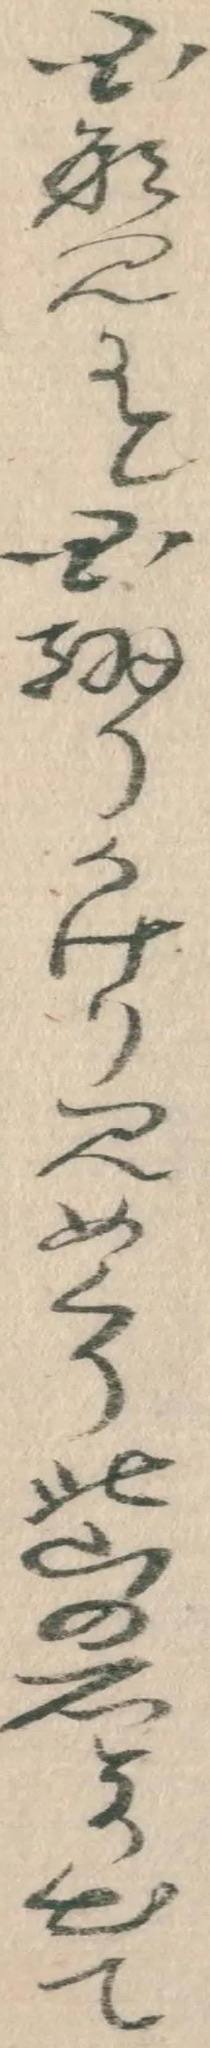国形見にと国翔りかけり見めくり此山の石とり出て
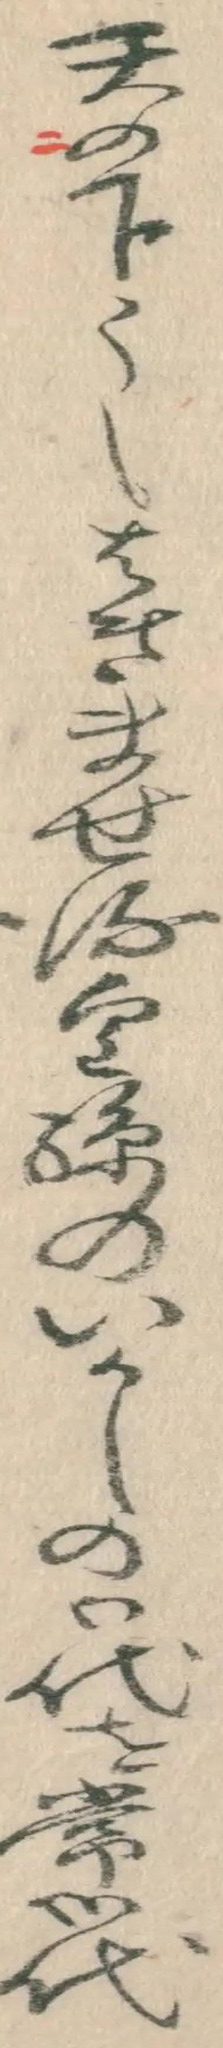天の下くしはきませる皇孫のいかしの御代を常御代
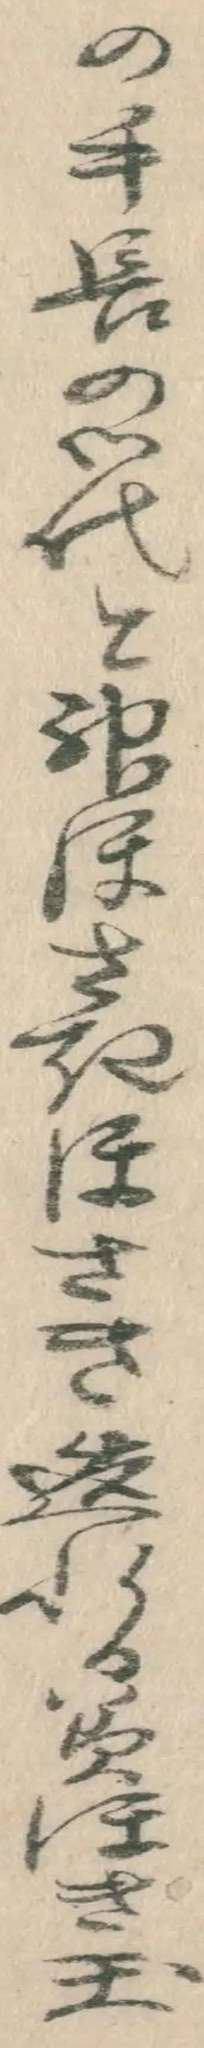の手長の御代と神ほさきほさき造れる美ほき玉
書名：出雲紀行. 20
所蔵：国立国会図書館 National Diet Library, JAPAN
